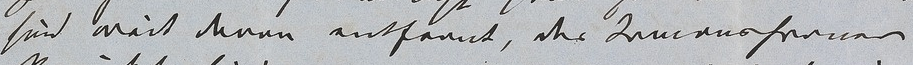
sind weit davon entfernt, das Romanshorner
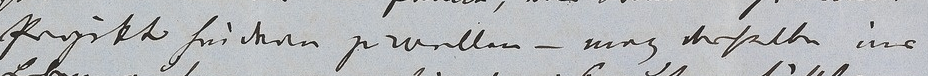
Projekt hindern zu wollen – mag dasselbe ins
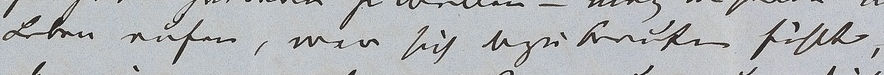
Leben rufen, wer sich dazu berufen fühlt, –
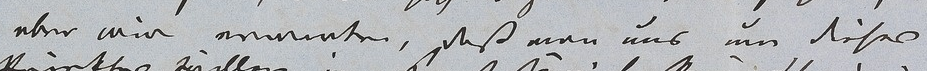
aber wir erwarten daß man uns um dieses
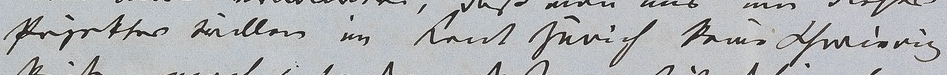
Projektes Willen im Kant Zürich keine Schwierig-
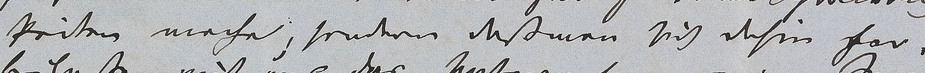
keiten mache, sondern daß man sich dahin her-
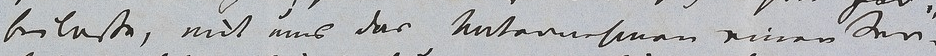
beilaße, mit uns das Unternehmen einer Ror-
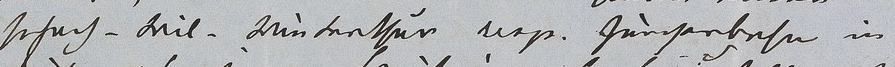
schach–Wil–Winterthur resp. Zürcherbahn in
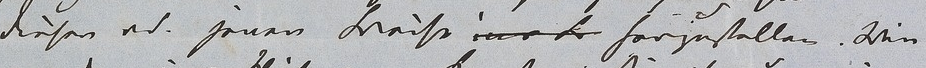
dieser od. jener Weise ins L herzustellen. Wir
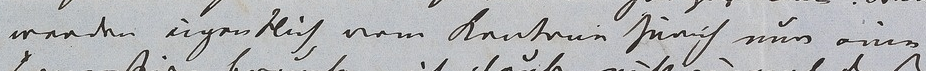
werden eigentlich vom Kantone Zürich nur eine
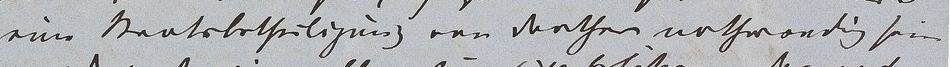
eine Staatsbetheiligung von dorther nothwendig sein
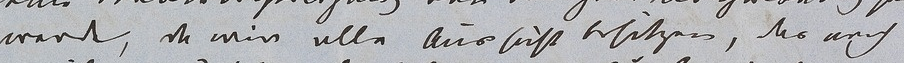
werde, da wir alle Aussicht besitzen, das noch
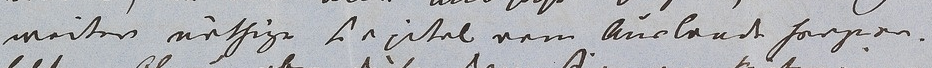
weiter nöthige Capital vom Auslande herzuer-
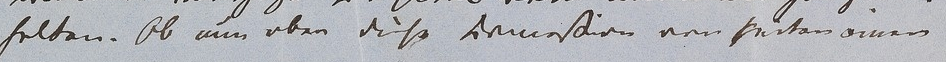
halten. Ob nun aber diese Conceßion von Seiten einer
